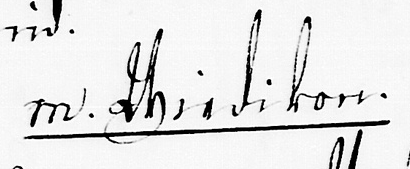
m. Wiedikon.
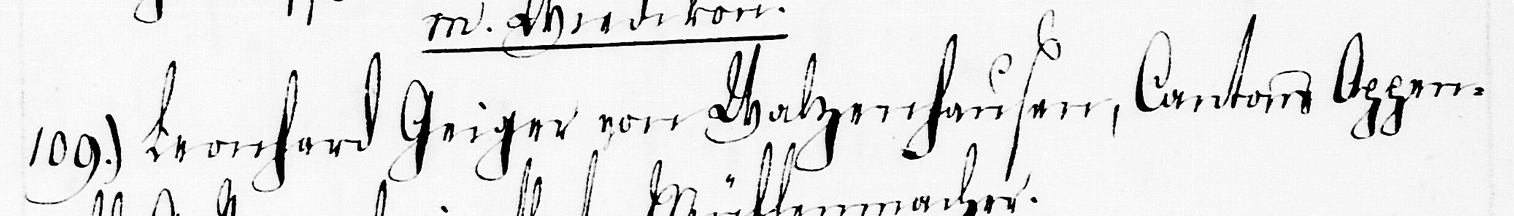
109.) Leonhard Geiger von Walzenhausen, Cantons Appen¬
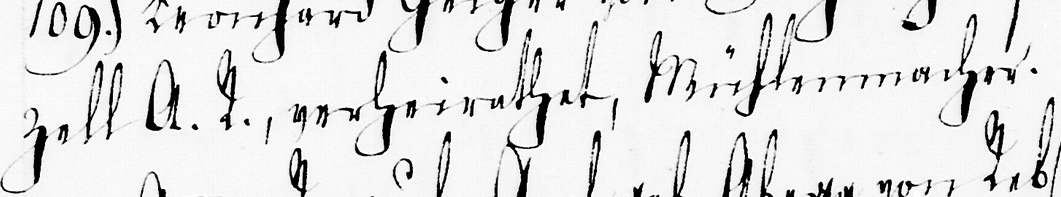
zell A. R., verheirathet, Mühlenmacher.
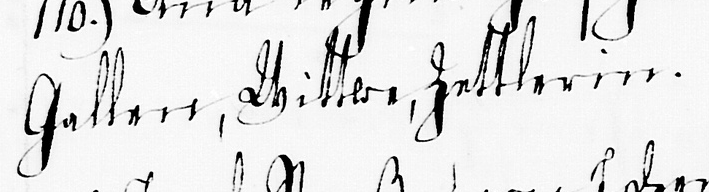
Gallen, Wittwe, Zettlerin.
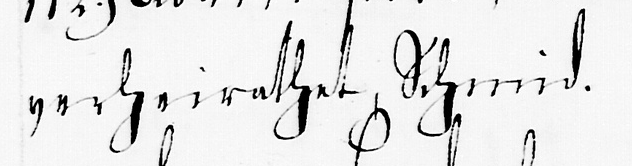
verheirathet, Schmid.
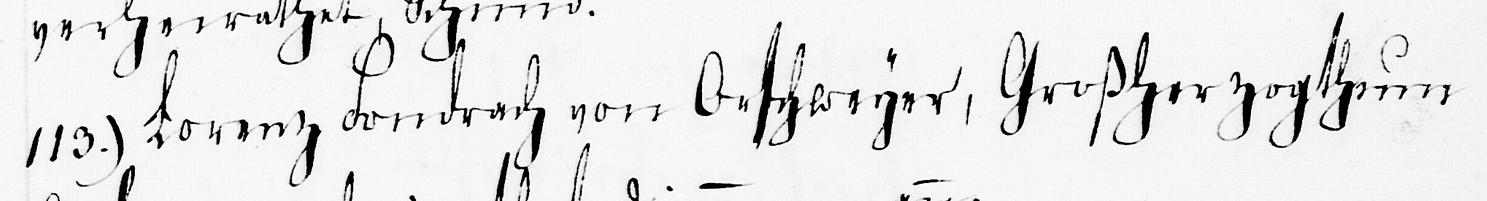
113.) Lorenz Fondrach von Orschweier, Großherzogthum
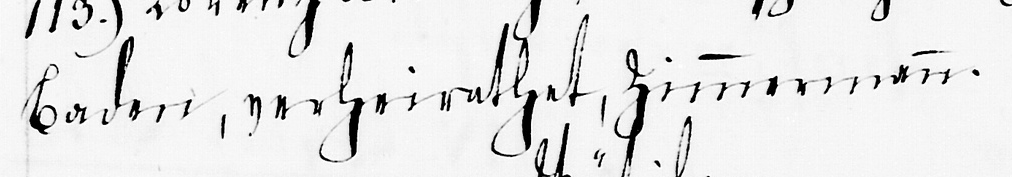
Baden, verheirathet, Zimmermann.
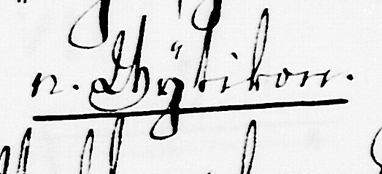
n. Wytikon.
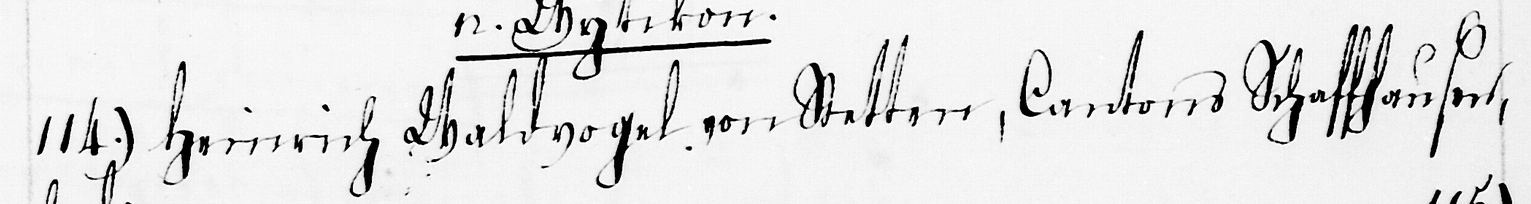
114.) Heinrich Waldvogel von Stetten, Cantons Schaffhausen,
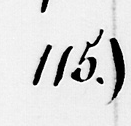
110.)
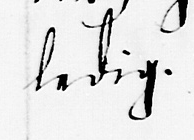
ledig.
